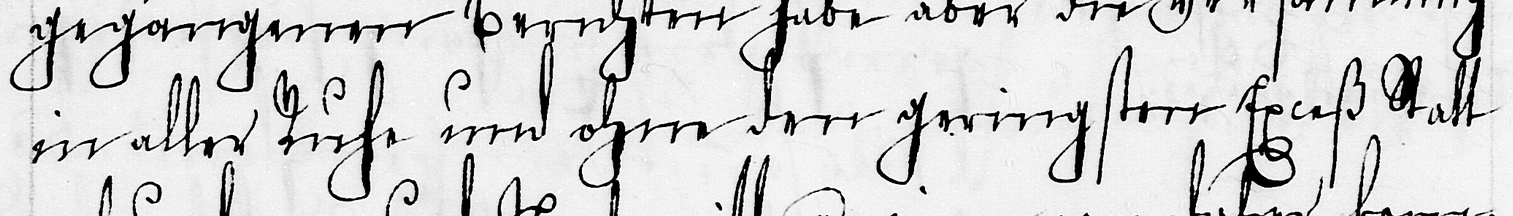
in aller Ruhe und ohne den geringsten Exceß Statt
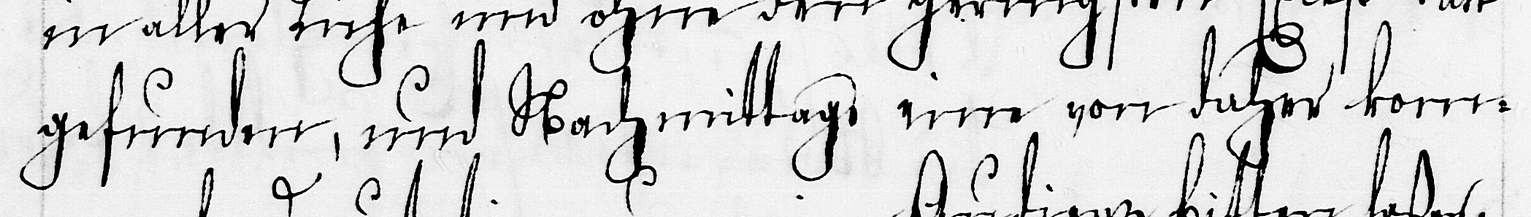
gefunden, und Nachmittags eine von daher kom¬
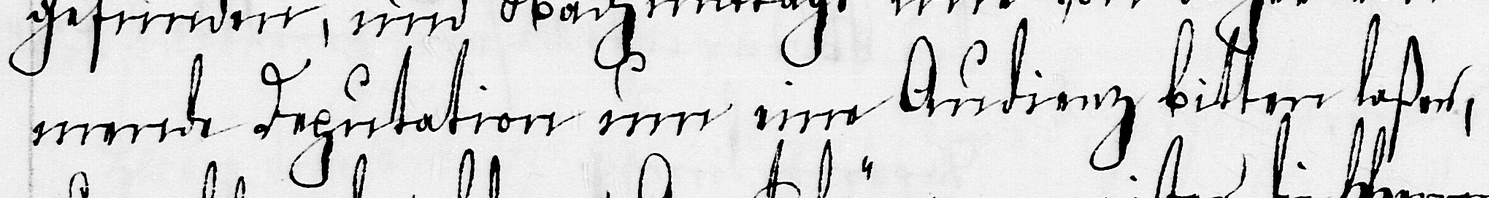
mende Deputation um eine Audienz bitten laßen,
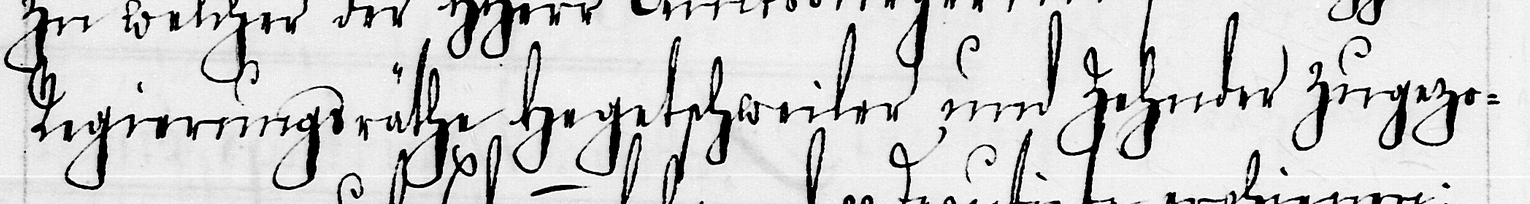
Regierungsräthe Hegetschweiler und Zehnder zugezo¬
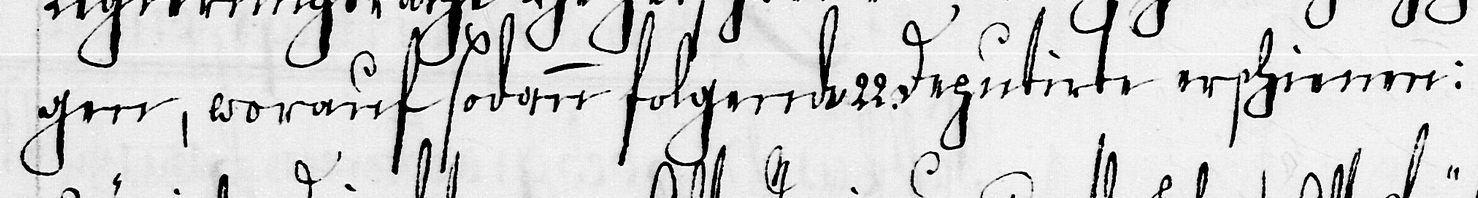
gen, worauf sodann folgende 22. Deputirte erschienen:
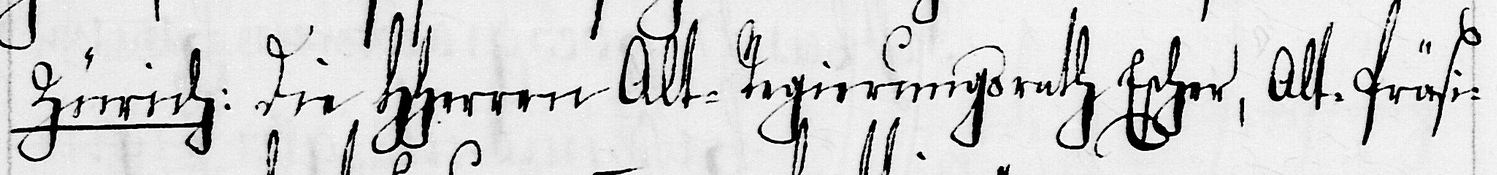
Zürich: Die HHerren Alt-Regierungsrath Escher, Alt-Präsi¬
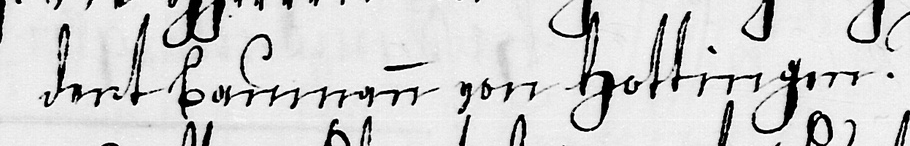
dent Baumann von Hottingen.
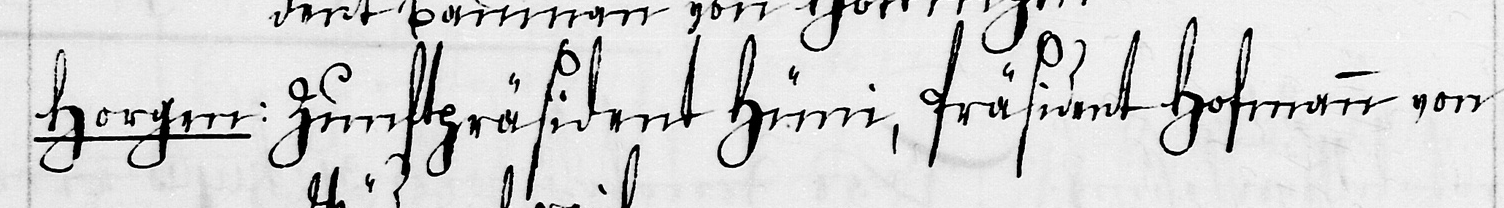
Horgen: Zunftpräsident Hüni, Präsident Hofmann von
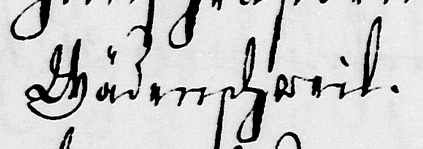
Wädenschweil.
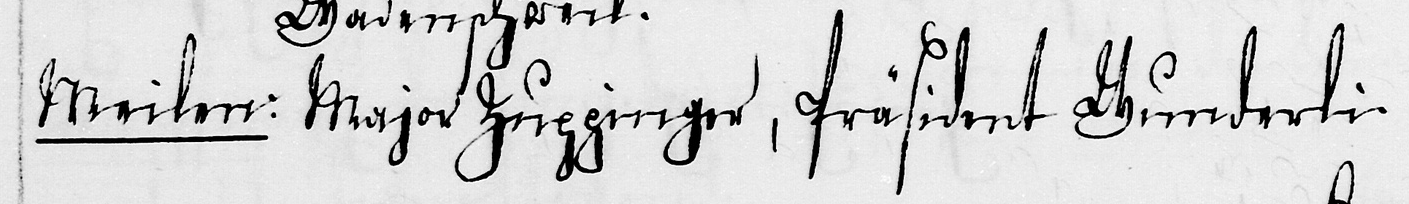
Meilen: Major Zuppinger, Präsident Wunderli.
